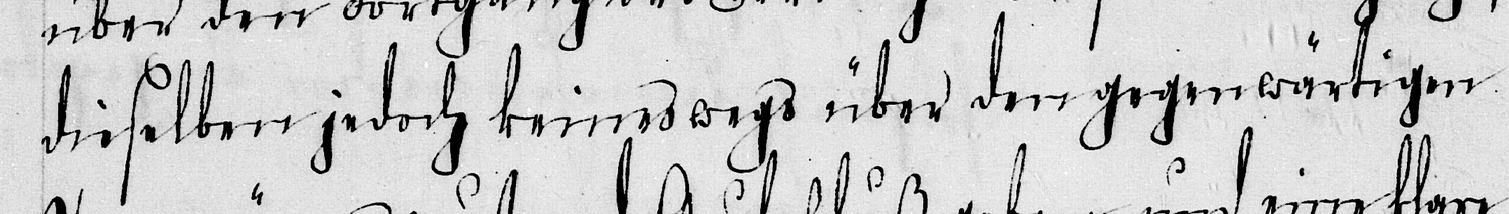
dieselben jedoch keineswegs über den gegenwärtigen
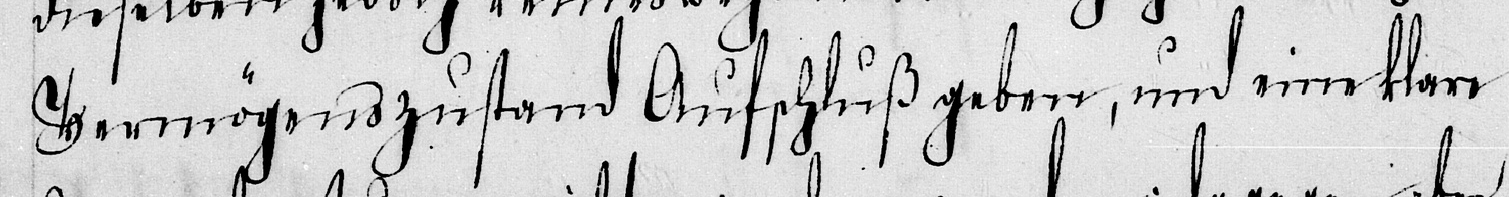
Vermögenszustand Aufschluß geben, und eine klare
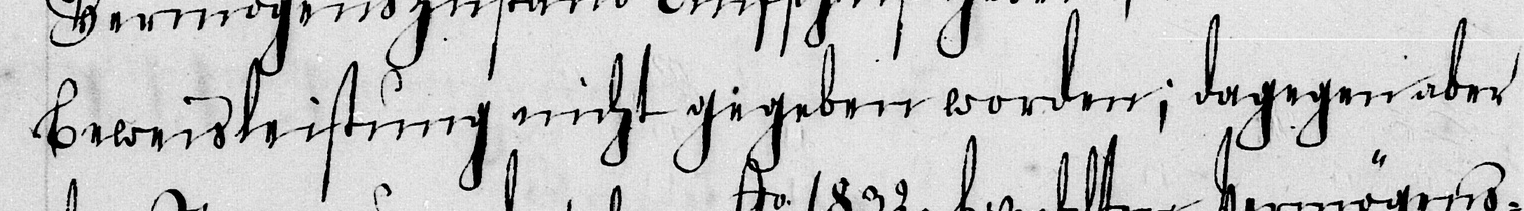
Beweisleistung nicht gegeben worden; dagegen aber
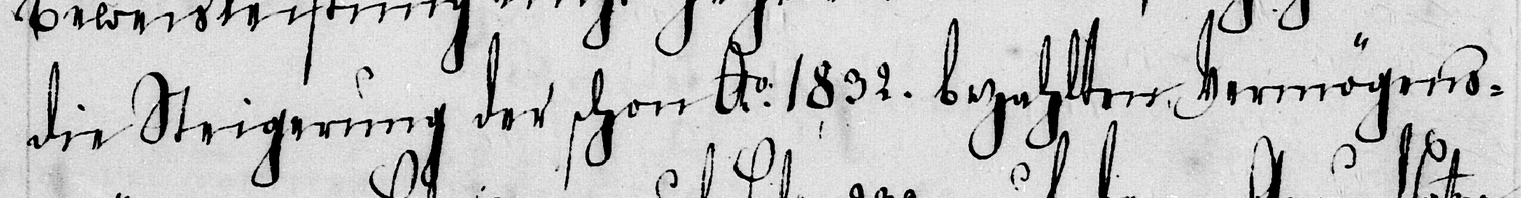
die Steigerung der schon Ao. 1832. bezahlten Vermögens¬
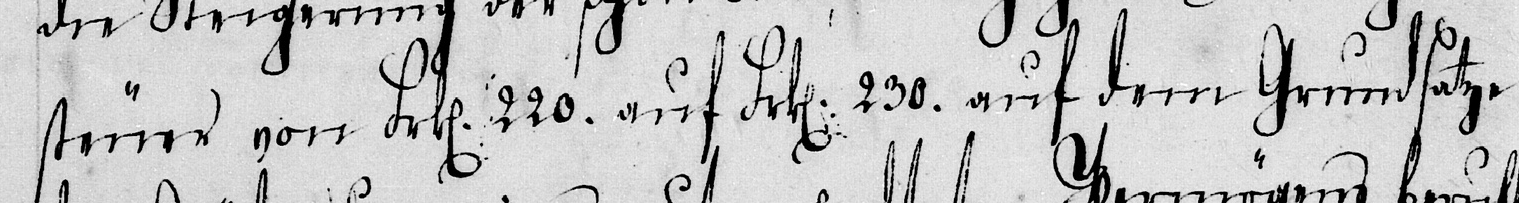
steuer von Frk[en]. 220. auf Frk[en]. 230. auf dem Grundsatze
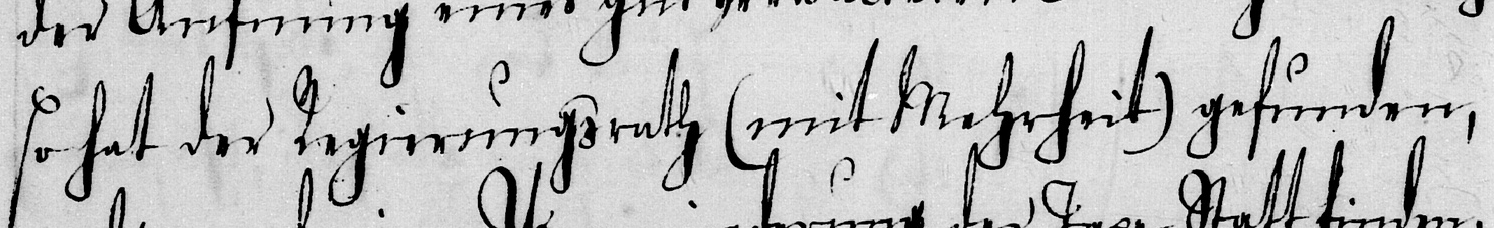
so hat der Regierungsrath (mit Mehrheit) gefunden,
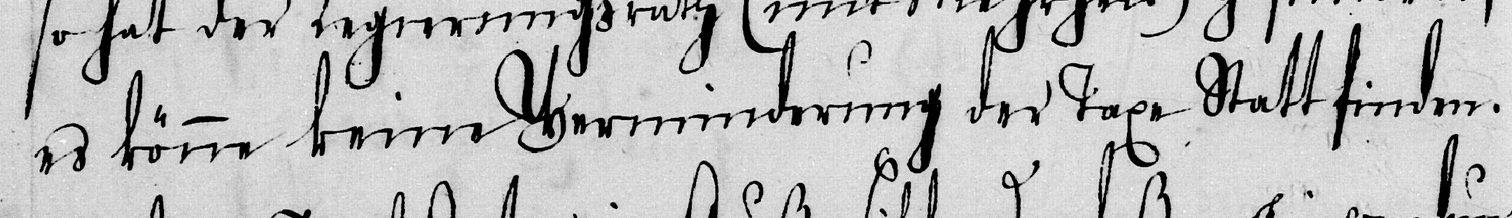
es könne keine Verminderung der Taxe Statt finden.
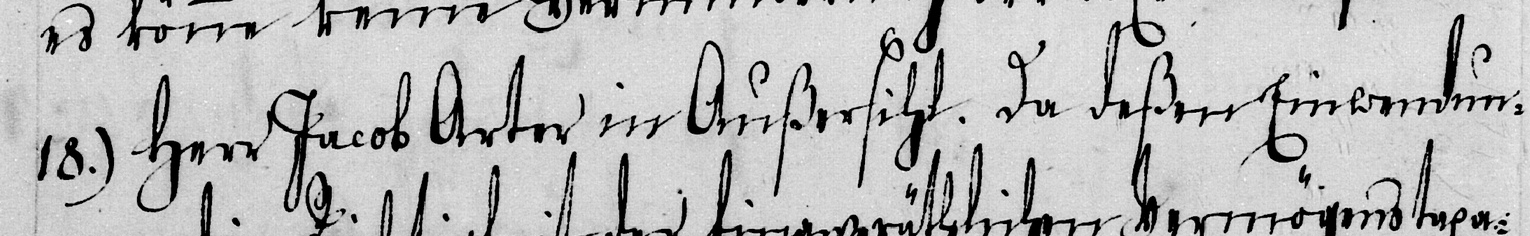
18.) Herr Jacob Arter in Außersihl. Da deßen Einwendun¬
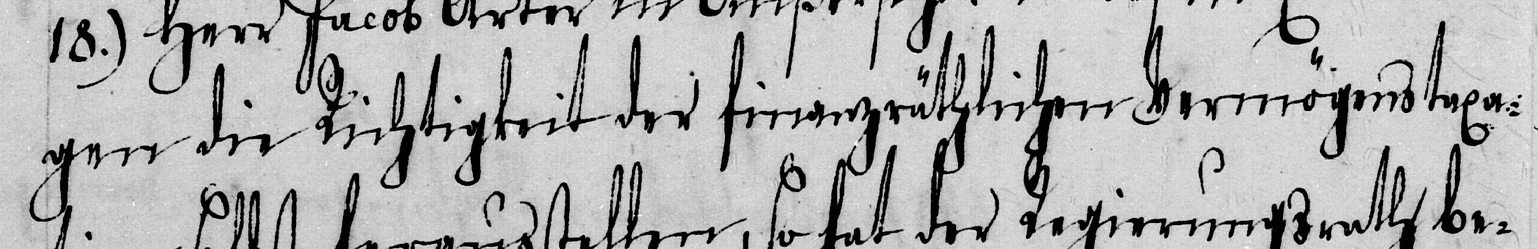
gen die Richtigkeit der finanzräthlichen Vermögenstax¬
